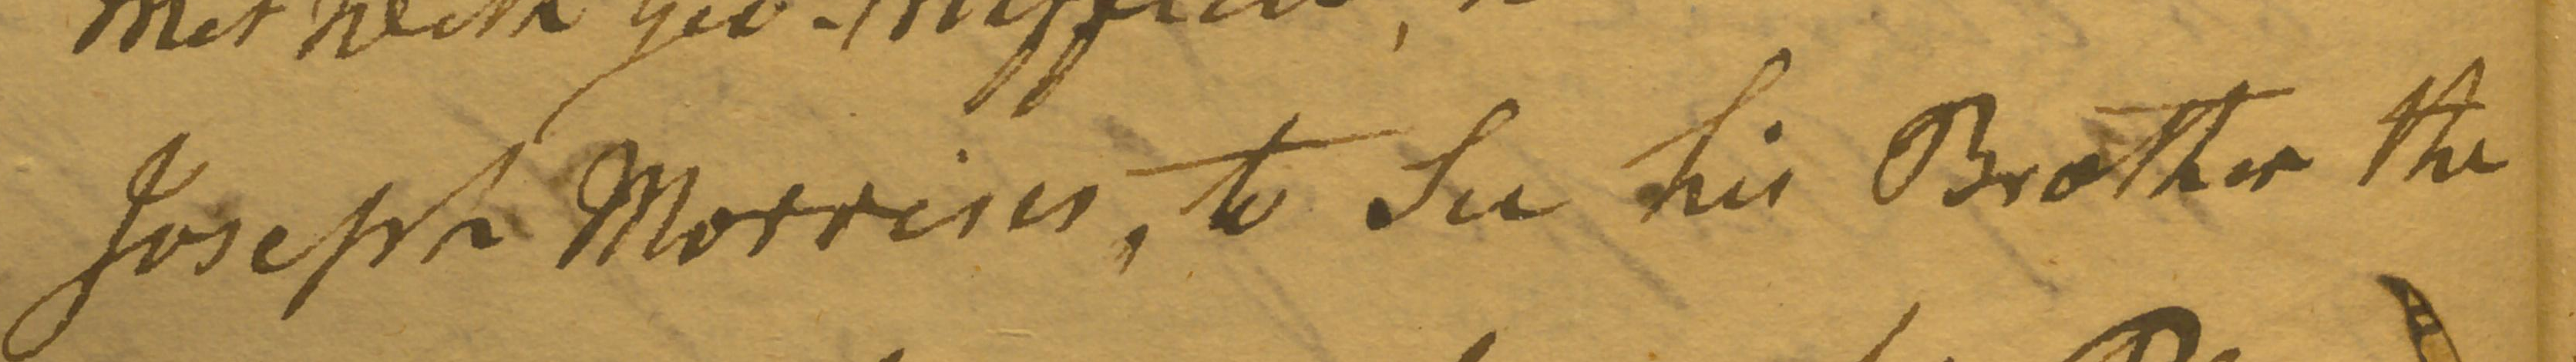Joseph Morrises, to see his Brother the
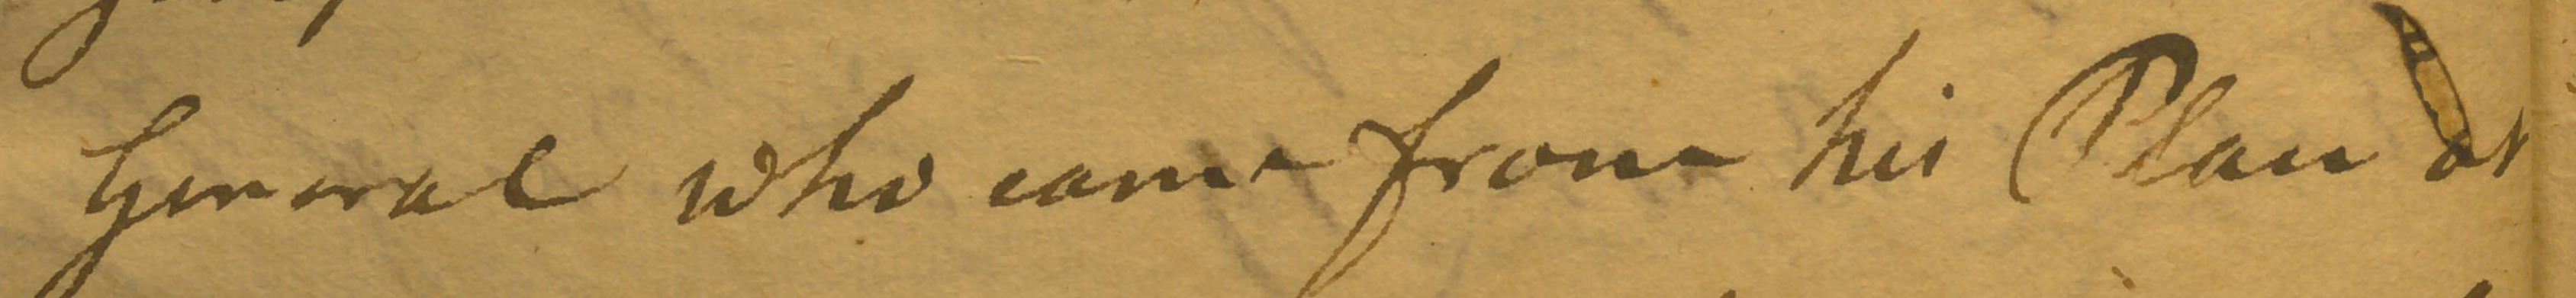General who came from his Place at
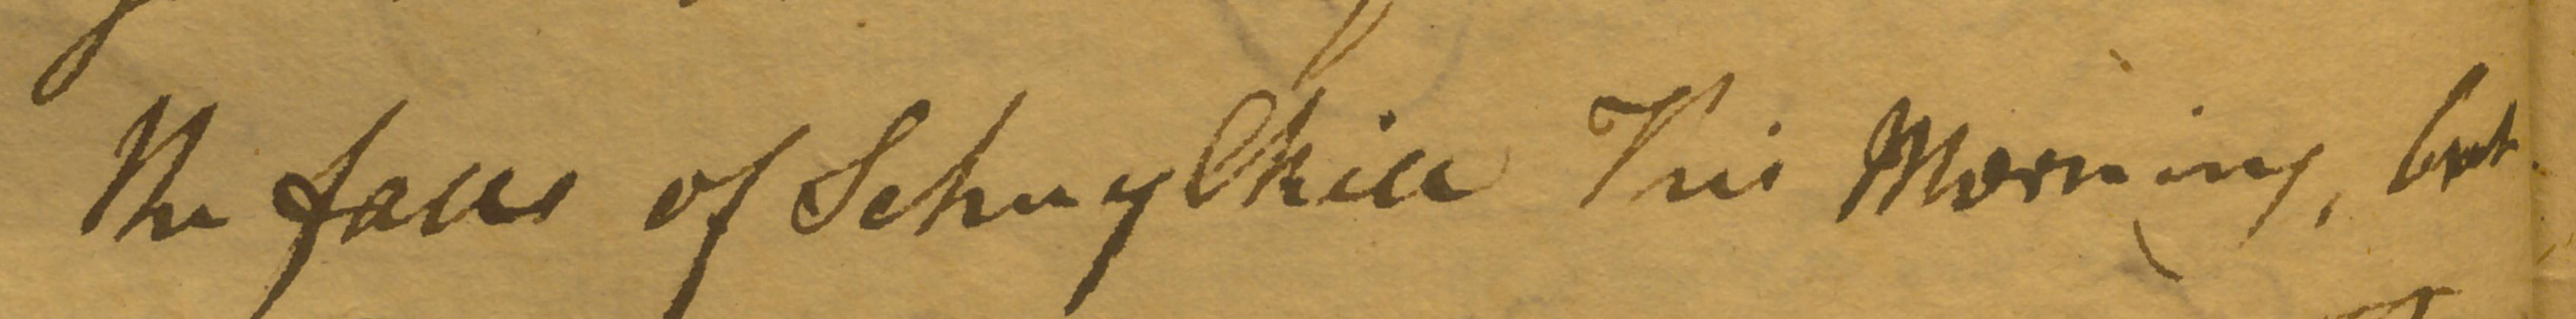the falls of Schuylkill This Moring, but
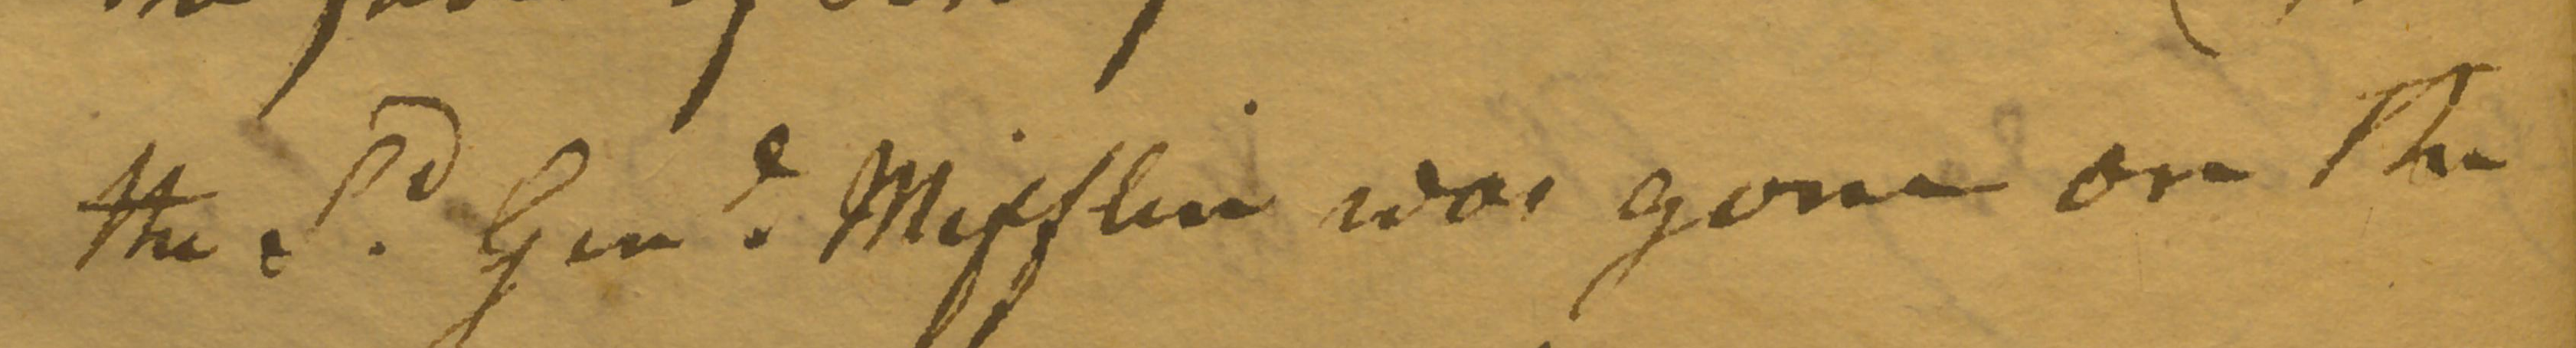the s^d. Gen^l. Mifflin was gone on the
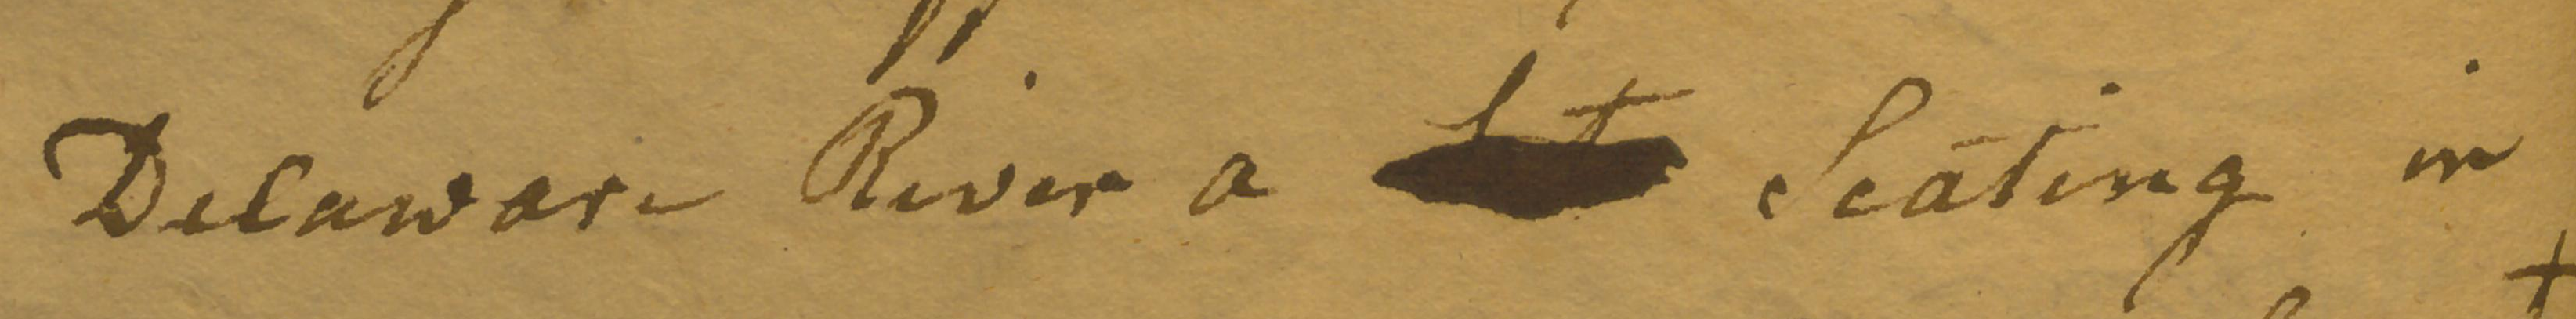Delaware River a [but] Seating in
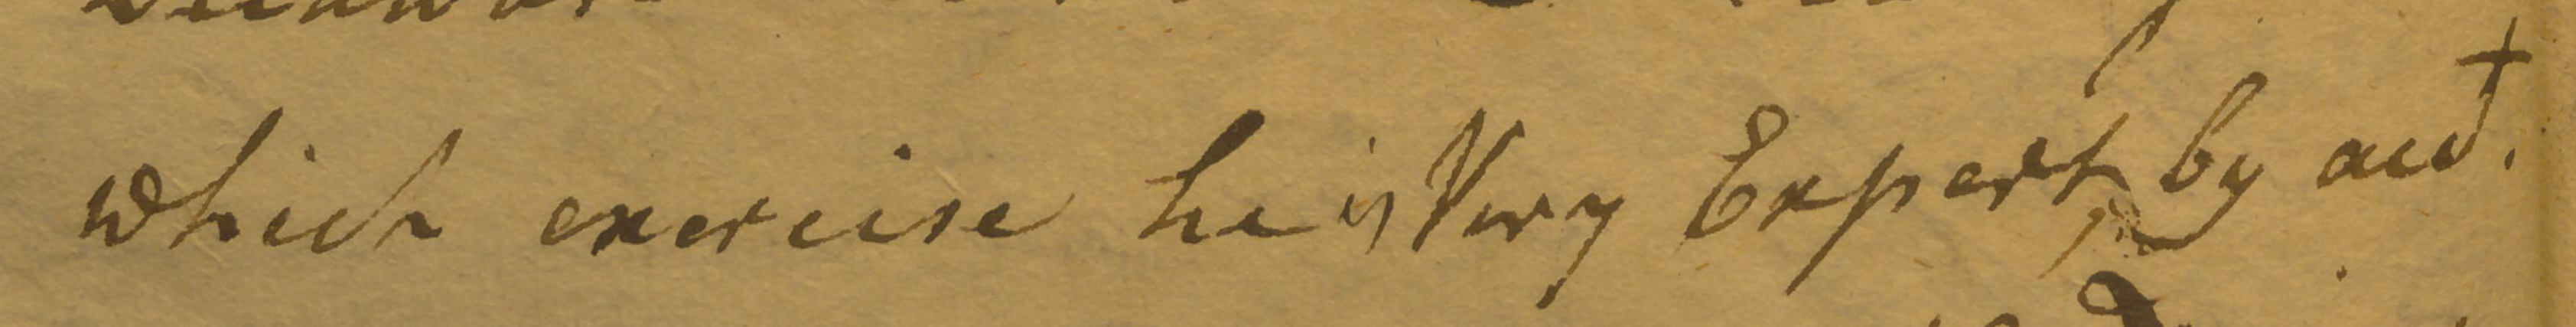which exercise he is Very Expert, by acc^t.
